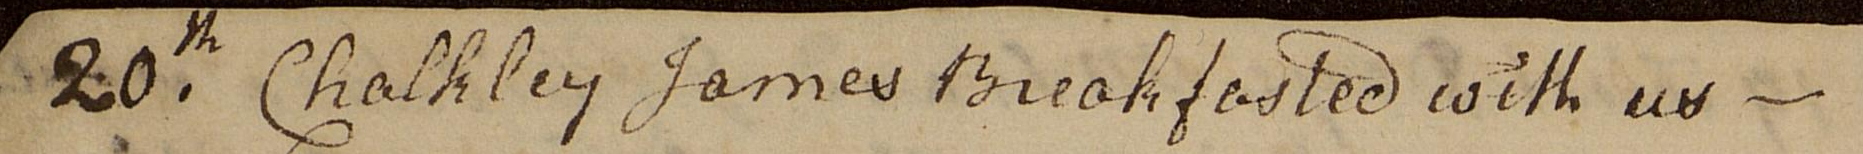20^th. Chalkley James Breakfasted with us-
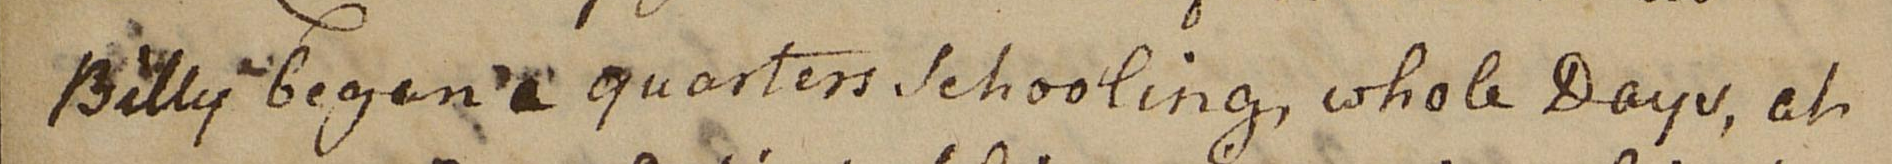Billy began & quarters Schooling, whole Days, at
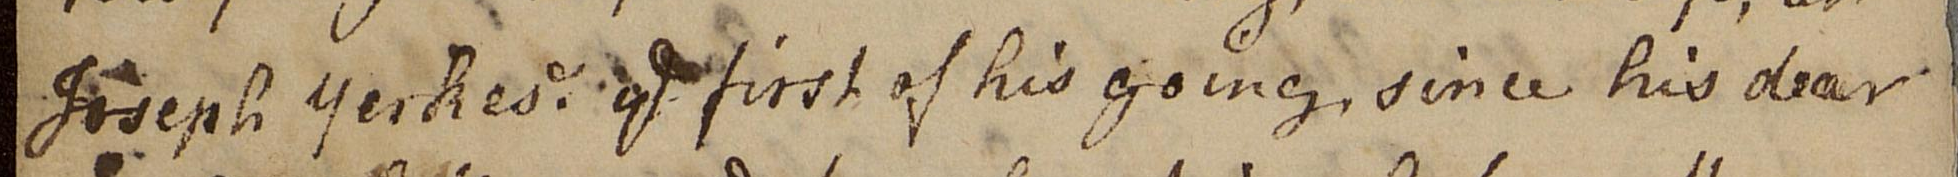Joseph Yerkes^s. y^e first of his going, since his dear
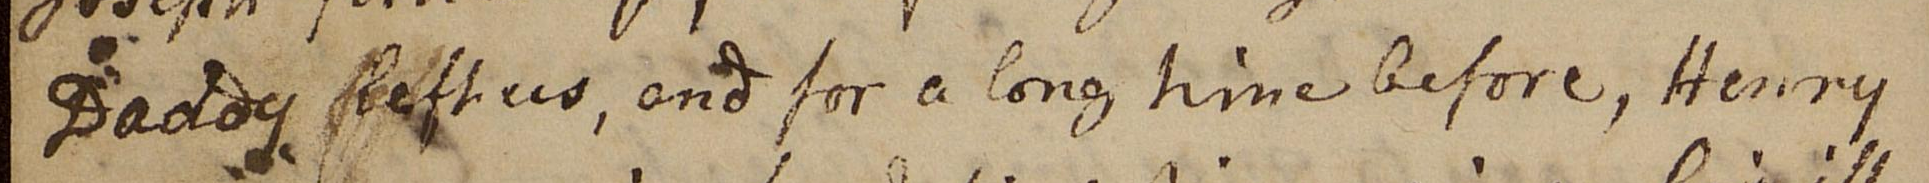Daddy left us, and for a long time before, Henry
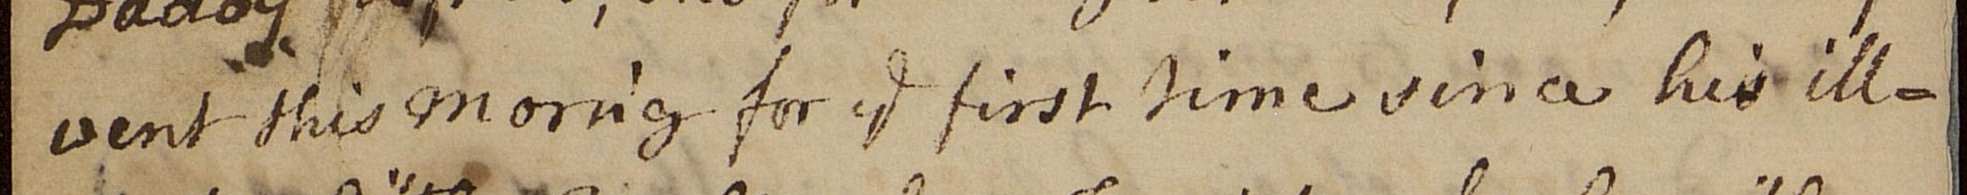went this morn'g for y^e first time since his ill-
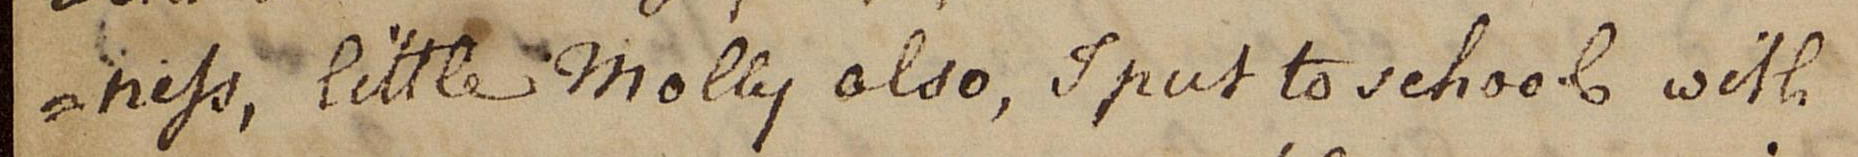-ness, little Molly also, I put to school with
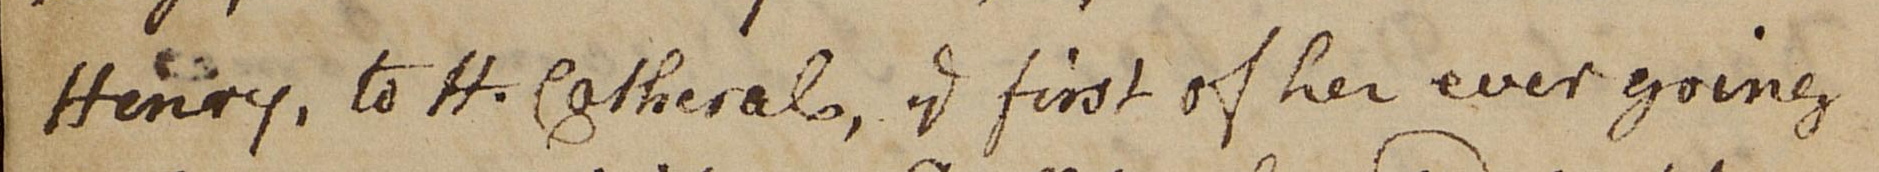Henry, to H. Catheral, y^e first of her ever going
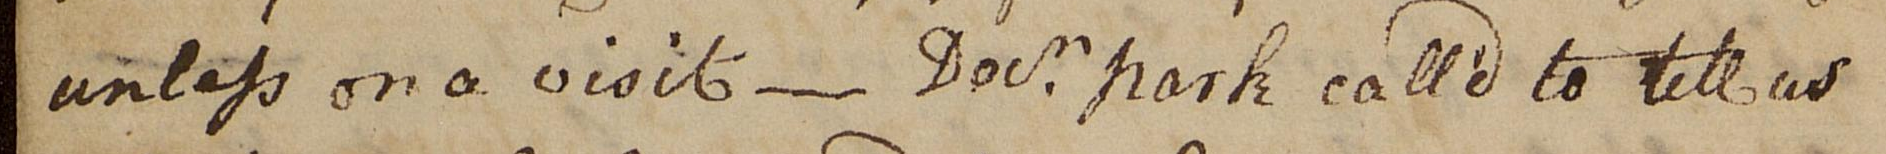unless on a visit- Doc^r. Park call'd to tell us
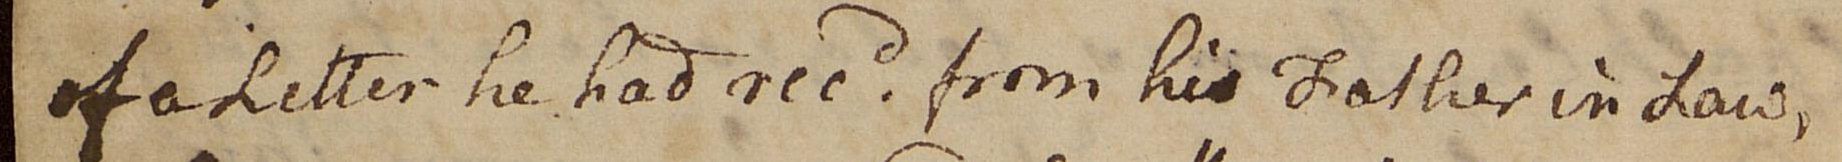of a Letter he had rec^d. from his Father in Law,
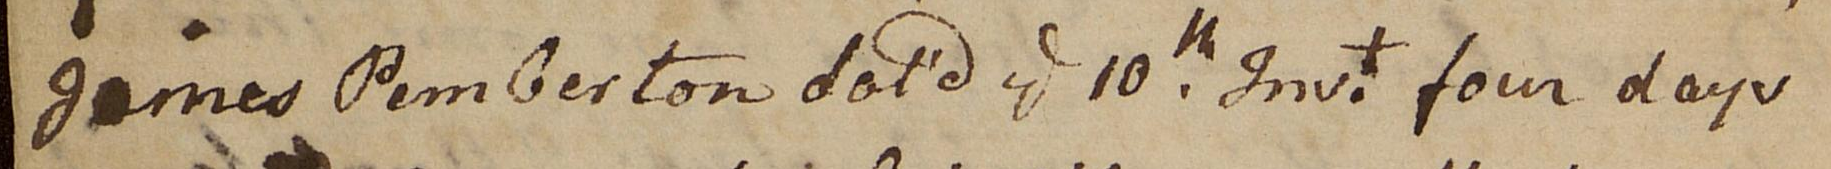James Pemberton dat'd y^e 10^th. Ins^t four days
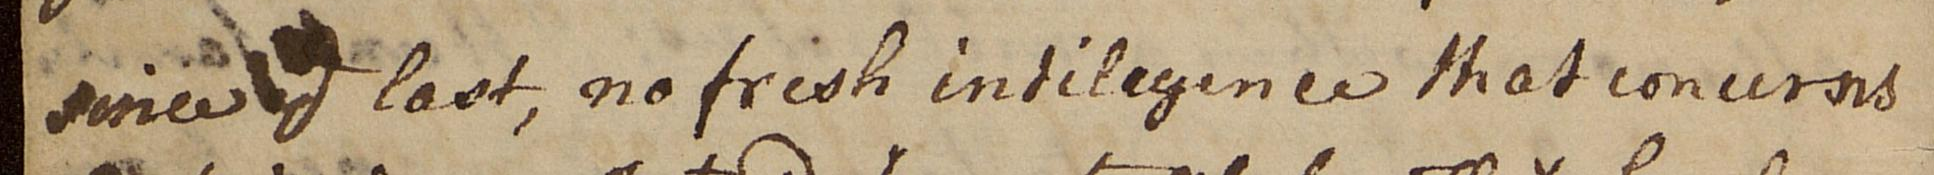since y^e last, no fresh intilegence that concerns
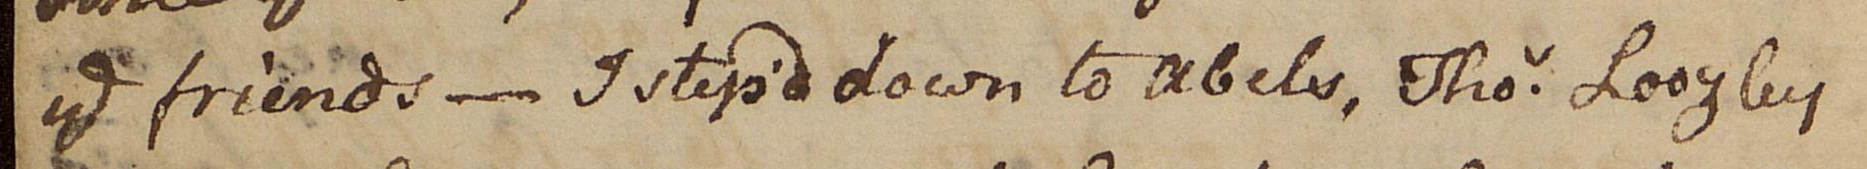y^e friends- I step'd down to Abels, Tho^s. Looyley
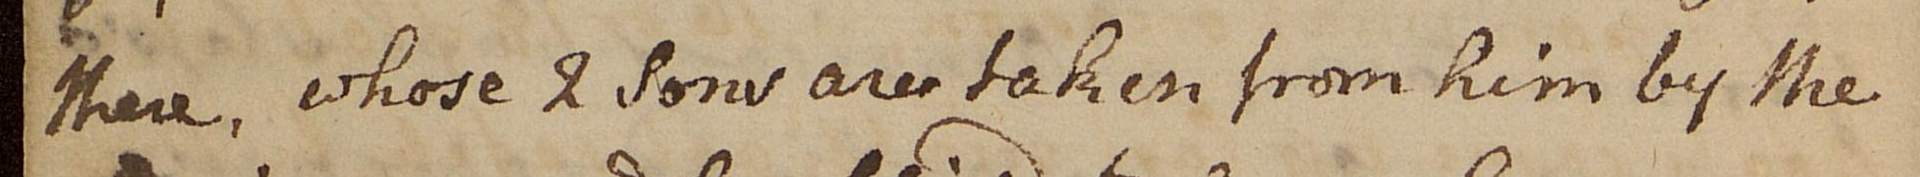there, whose 2 sons are taken from him by the
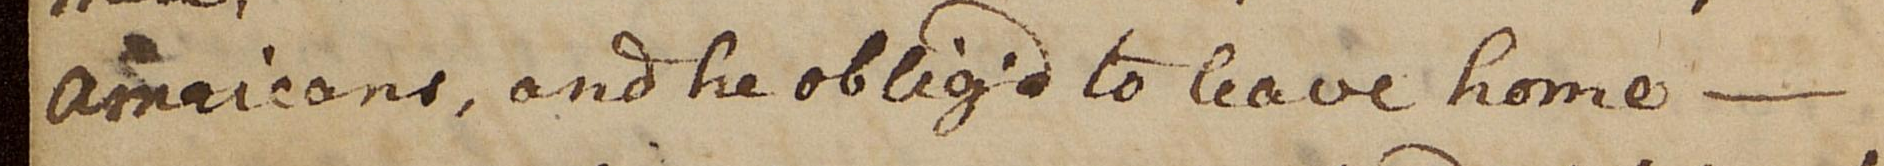Amaricans, and he oblig'd to leave home-
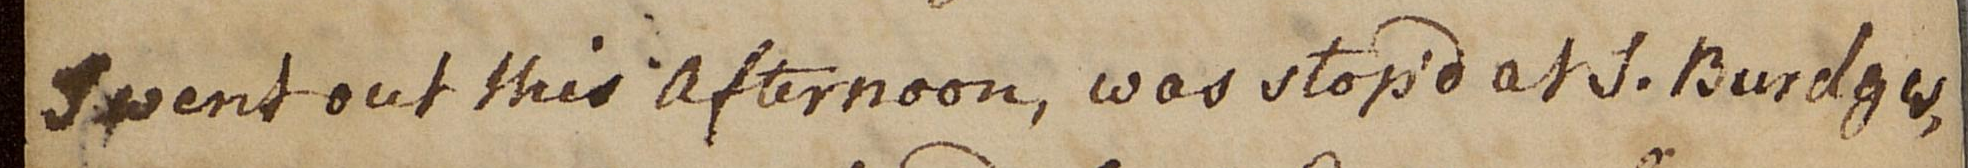I went out this afternoon, was stop'd at S. Burdges,
